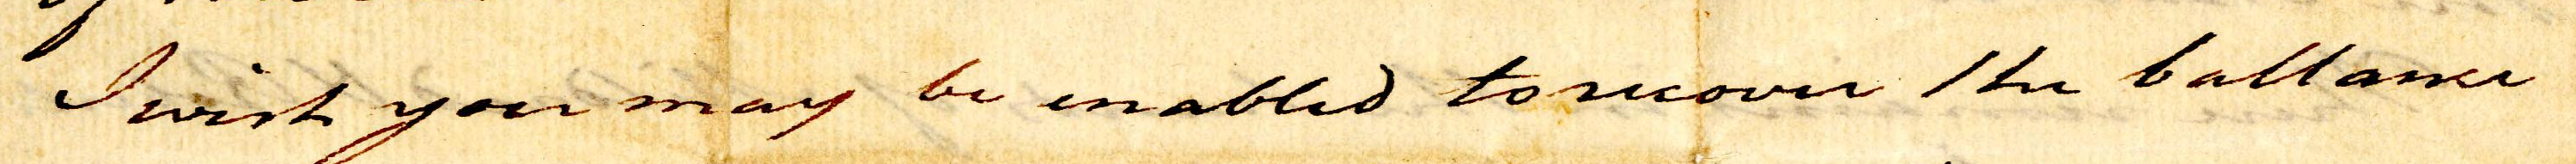I wish you may be enabled to recover the ballance
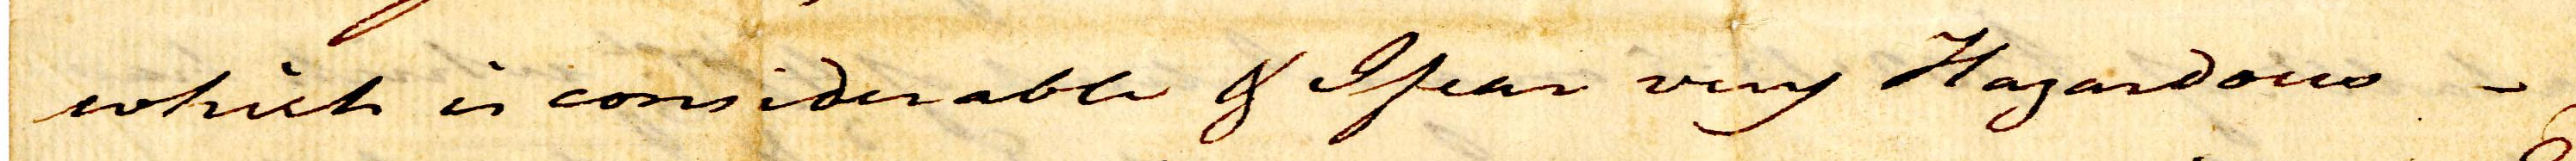which is considerable & I fear very Hazardous-
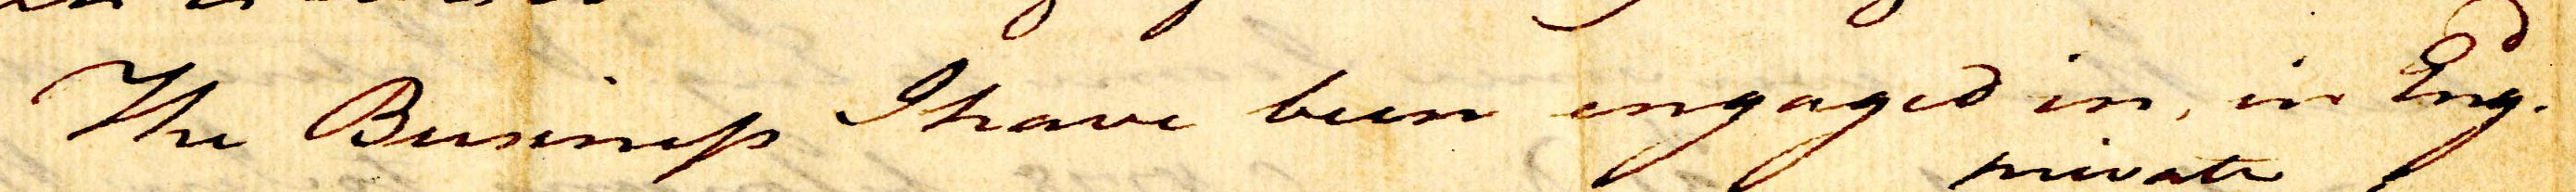The Business I have been engaged in, in Eng^d.
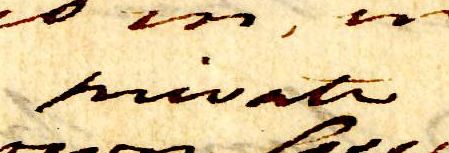private
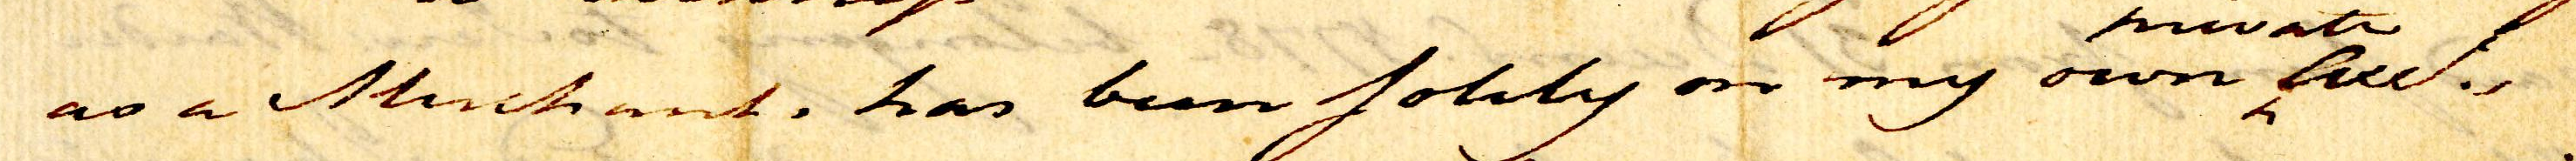as a Merchant, has been solely on my own ^ Acc^t.
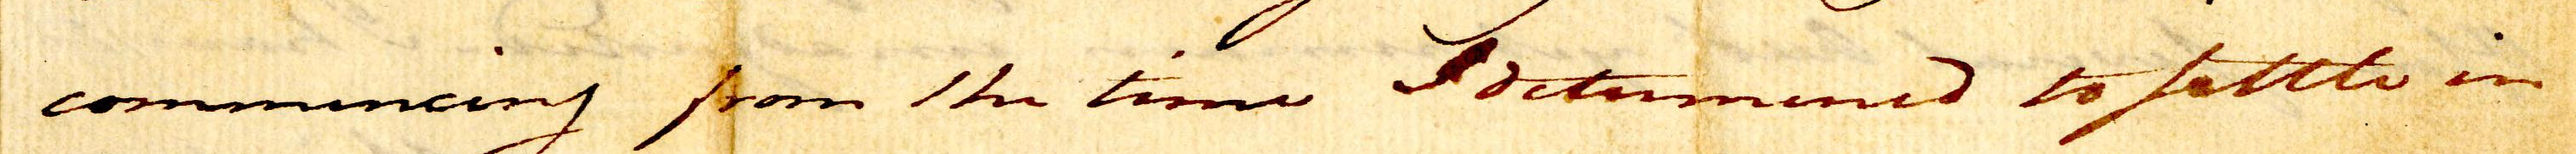commencing from the time I determined to settle in
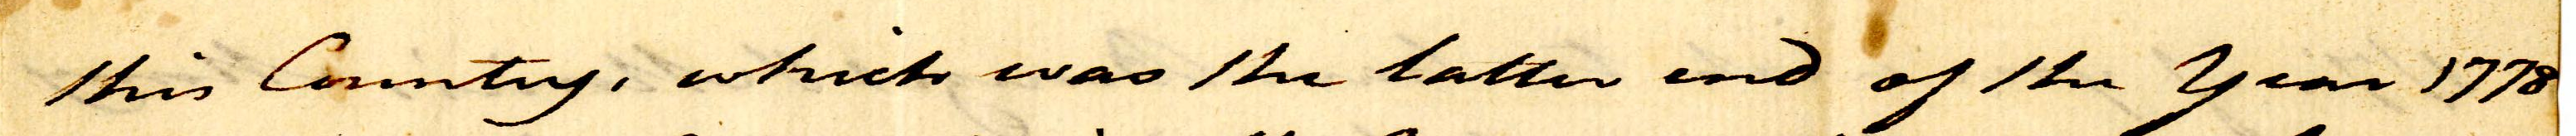this Country, which was the latter end of the Year 1778
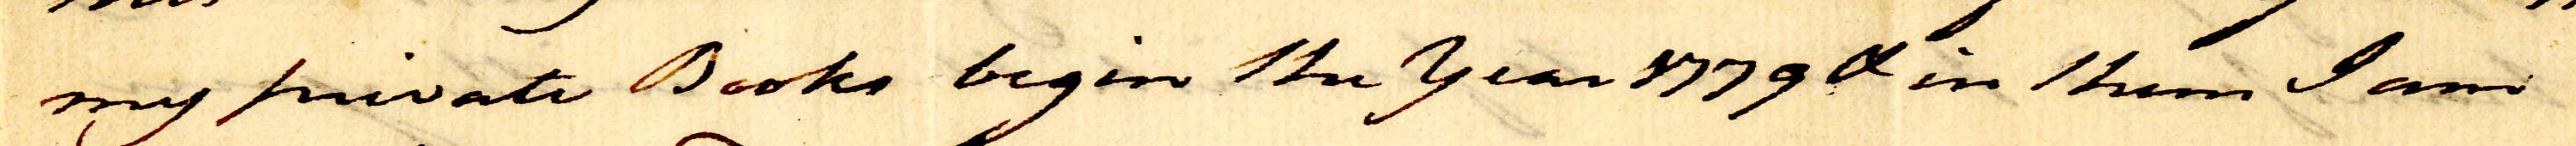my private Books begin the Year 1779 & in them I am
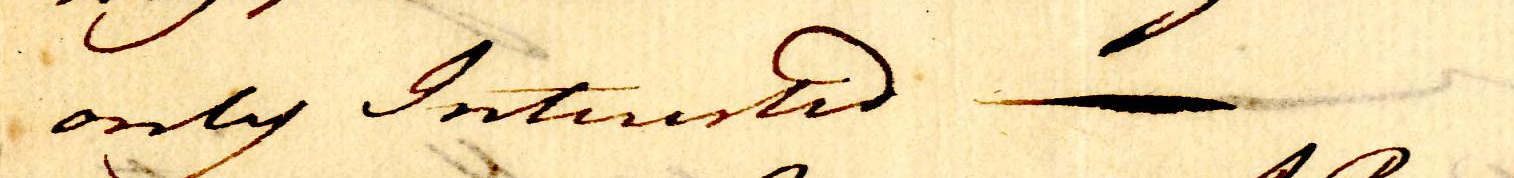only Interested-
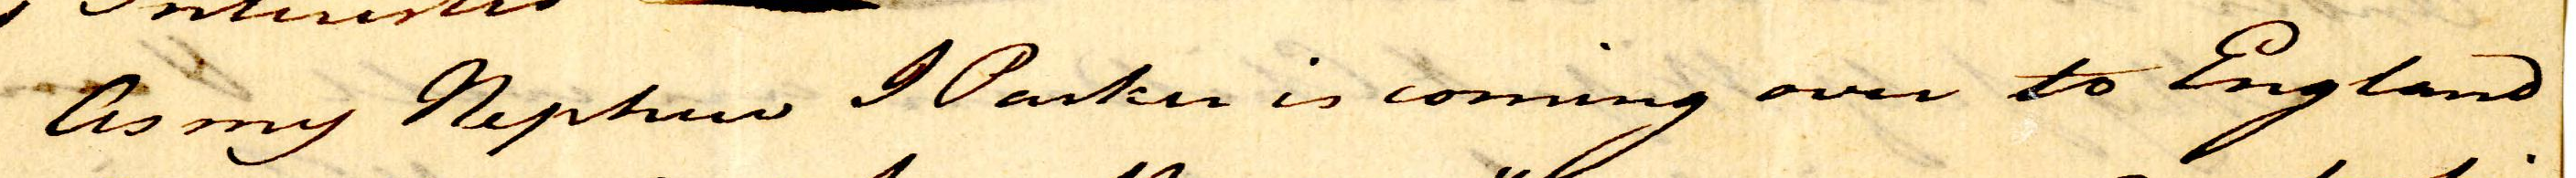As my Nephew J Parker is coming over to England
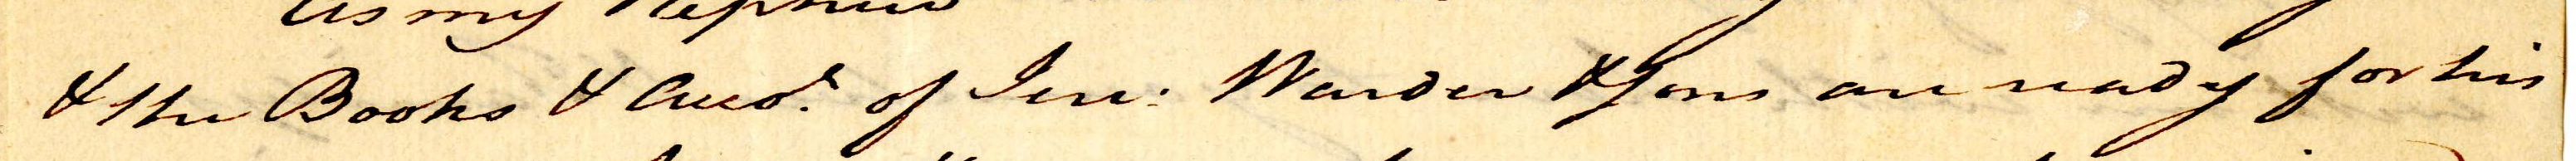& the Books & Acco^t. of Jere. Warder & Sons are ready for his
